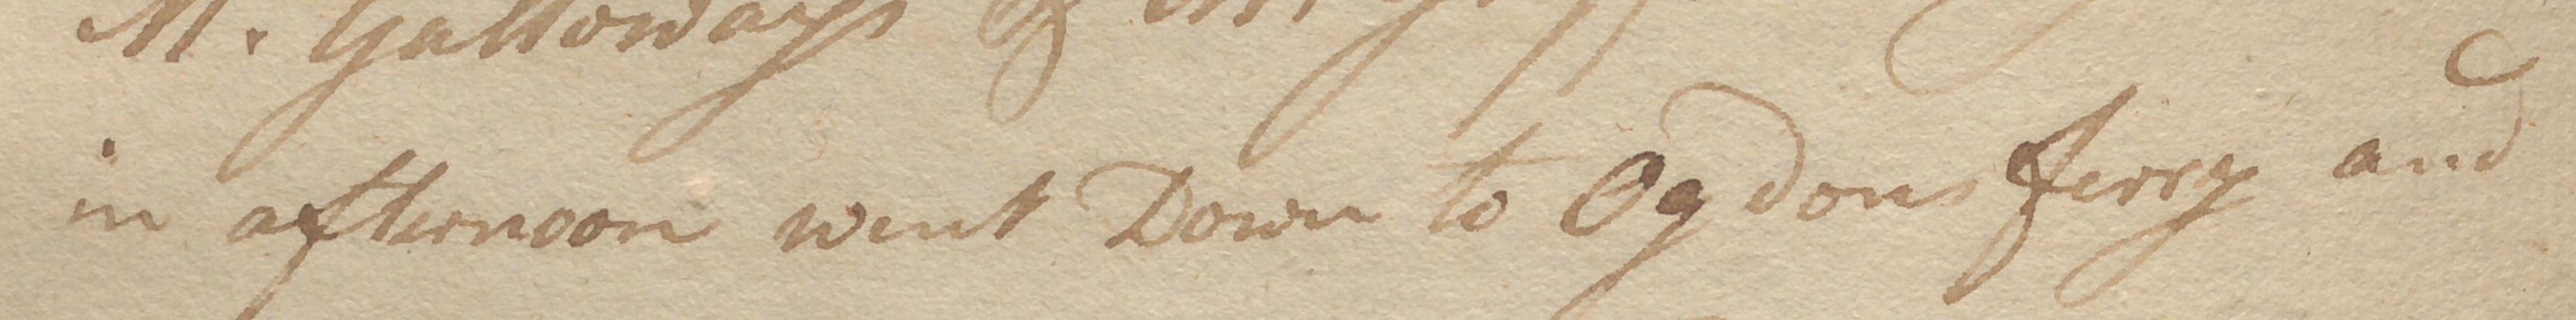in afternoon went Down to Ogdons ferry and
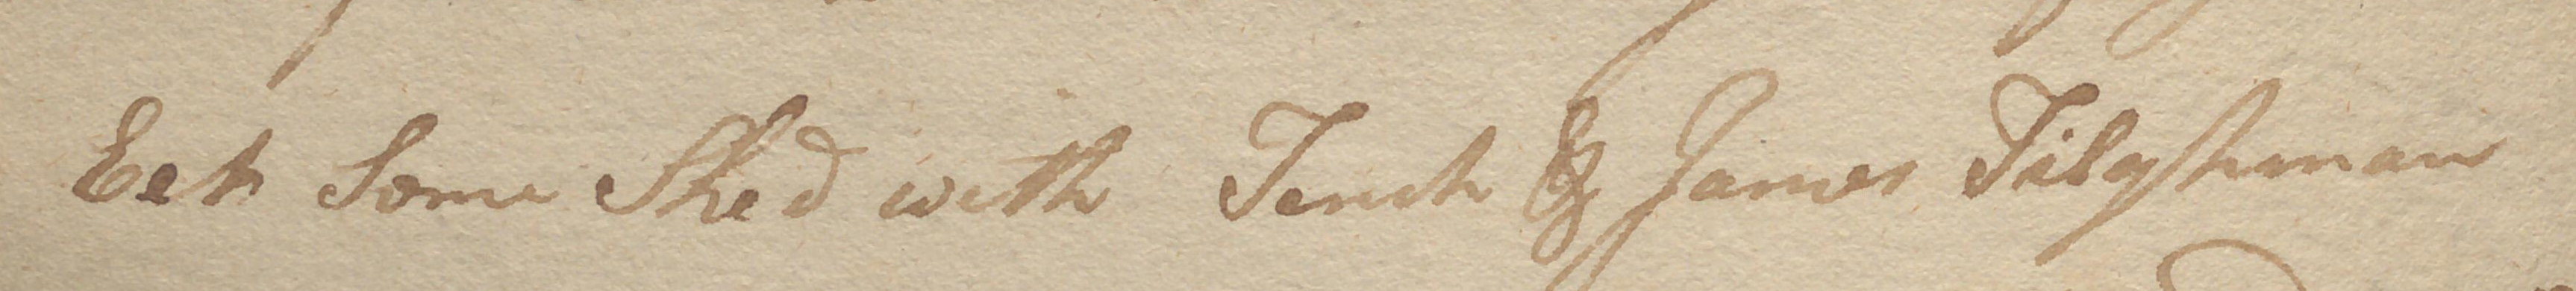Eet some Shed with Tench & James Tilghman
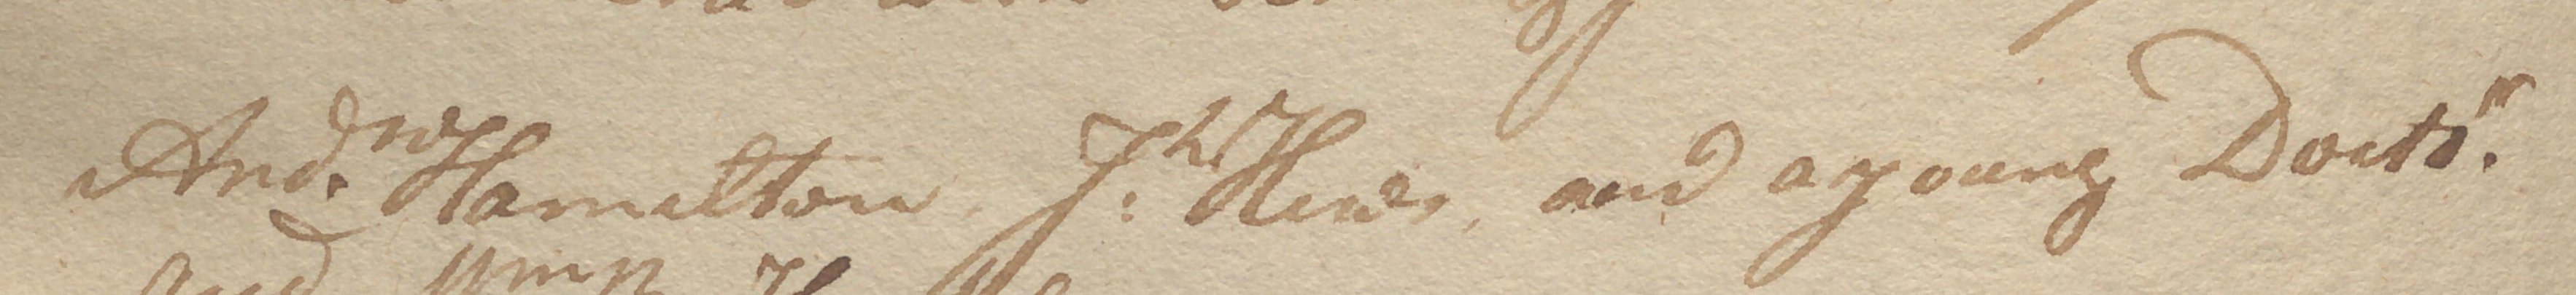And^w. Hamelton J^h. Hews, and a young Docto^r.
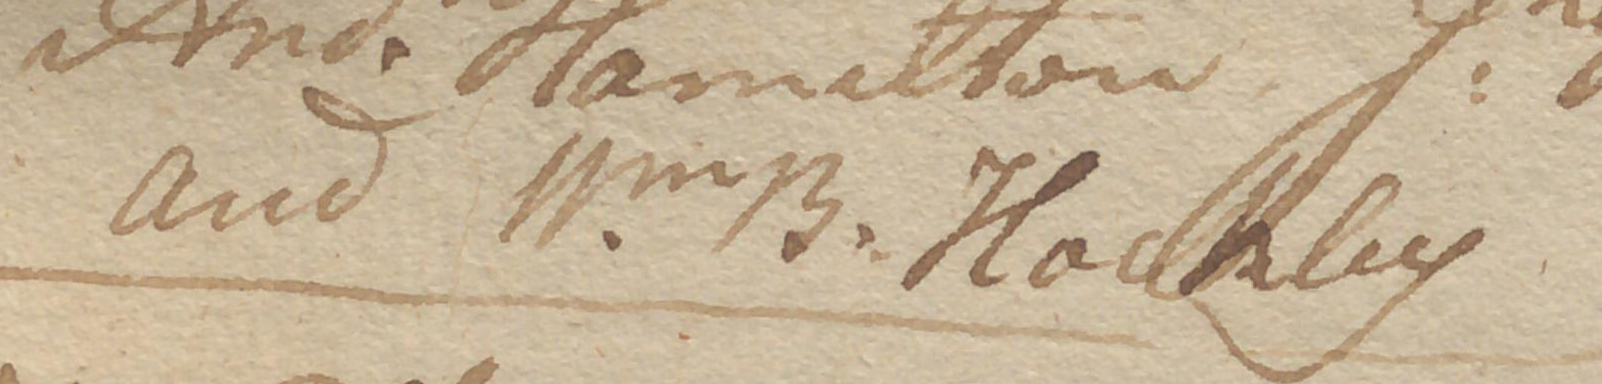aned W^m. B. Hockley
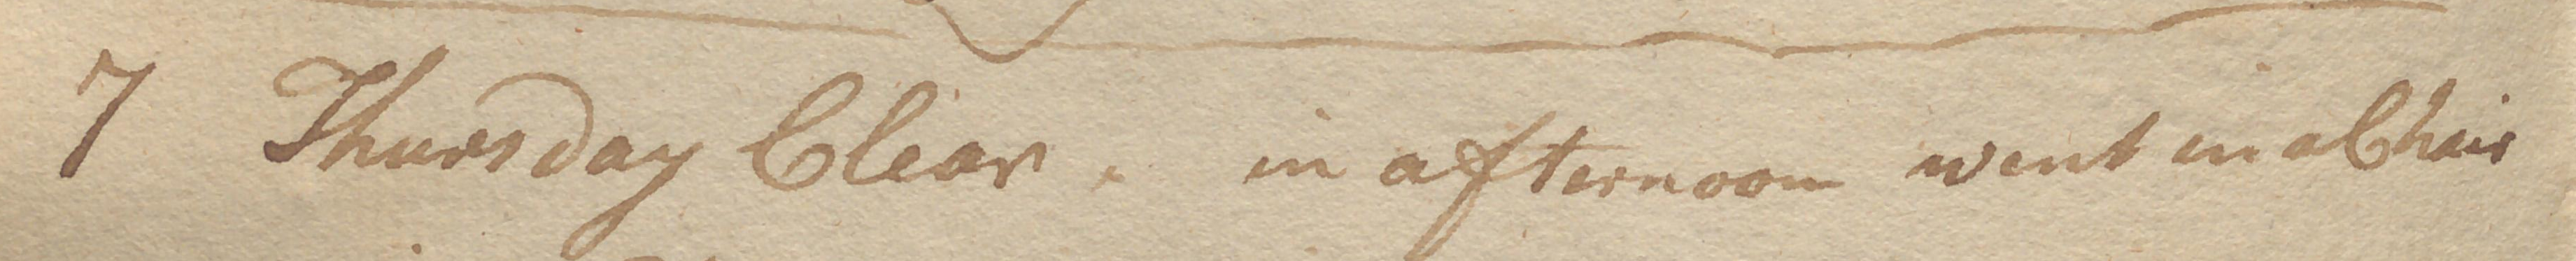7 Thursday Clear, in afternoon went in a Chair
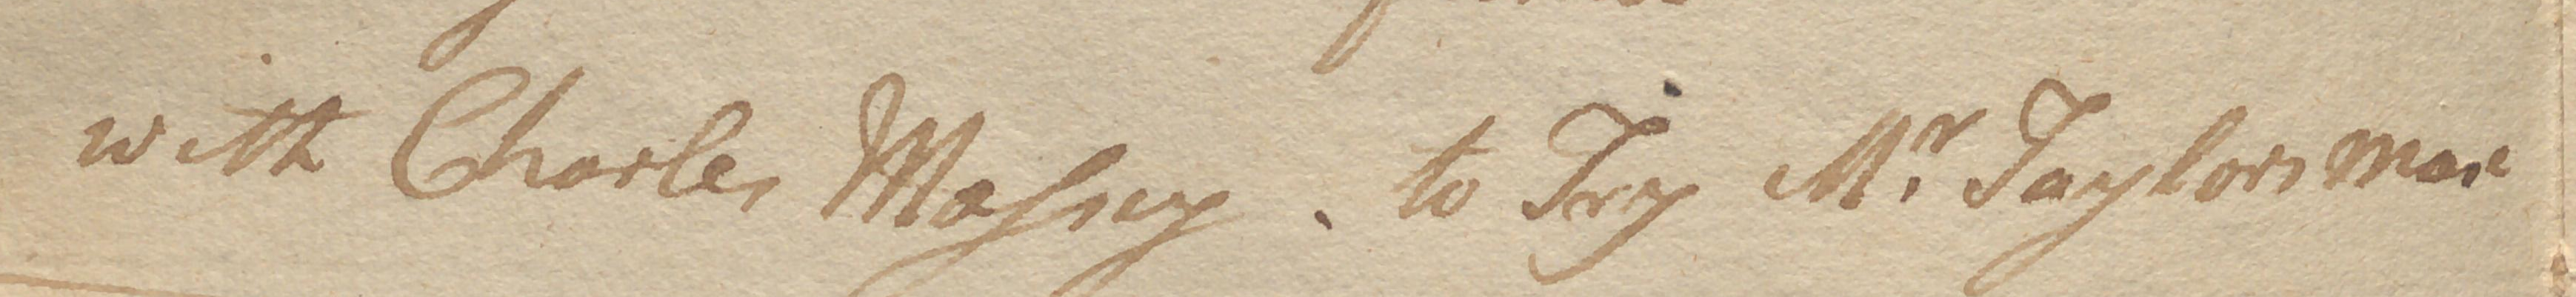with Charles Massey. to Try M^r. Taylors mare
